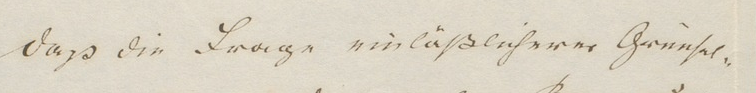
daß die Frage einläßlicherer Grimsel -
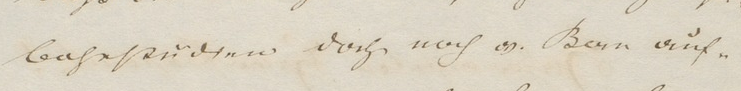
bahnstudien doch noch v. Bern auf-
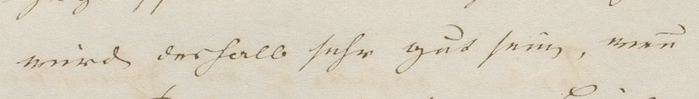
wird deshalb sehr gut sein, wenn
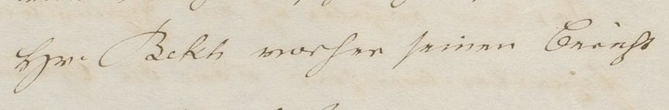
Hr. Bekh vorher seinen Bericht
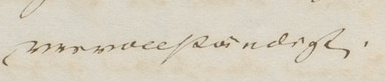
vervollständigt. –
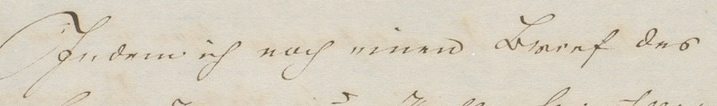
Indem ich noch einen Brief des
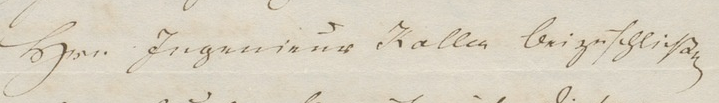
Hrn. Ingenieur Koller beizuschließen
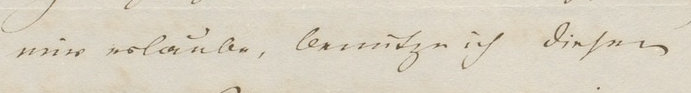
mir erlaube, benütze ich diesen
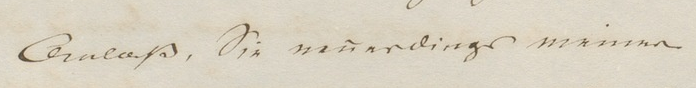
Anlaß, Sie neuerdings meiner
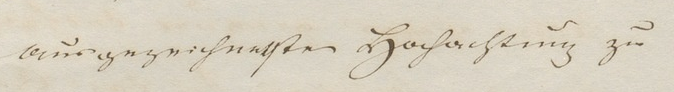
ausgezeichnetsten Hochachtung zu
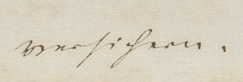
versichern.
